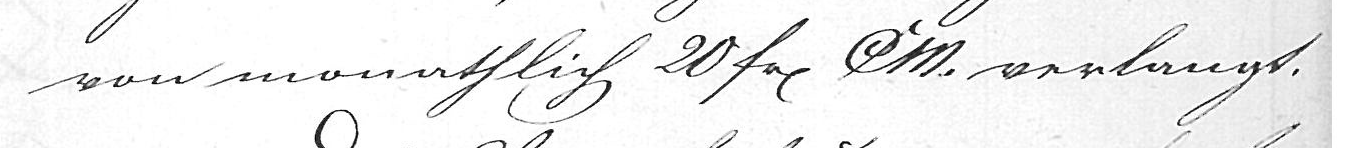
von monatlich 20 fI CM verlangt.
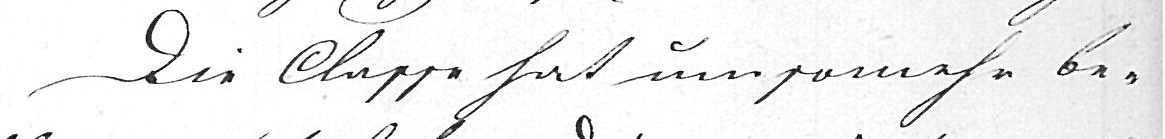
Die Classe hat umsomehr be-
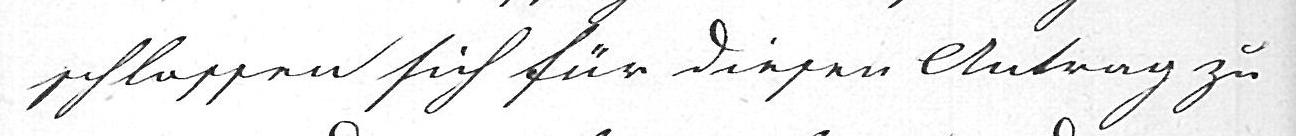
schlossen sich für diesen Antrag zu
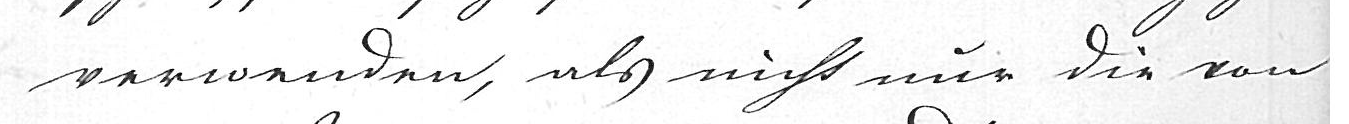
verwenden, als nicht nur die von
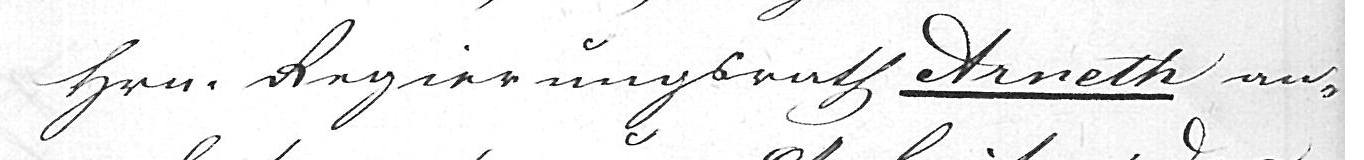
Hrn. Regierungsrath Arneth an-
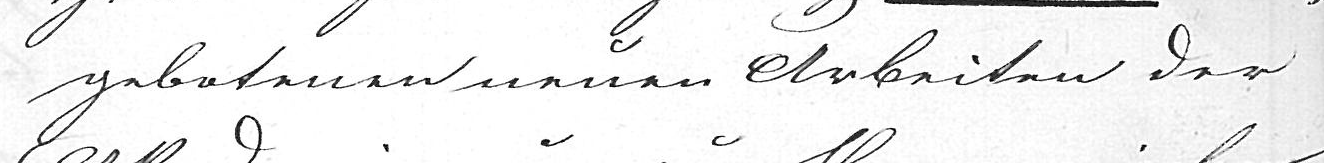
gebotenen neuen Arbeiten der
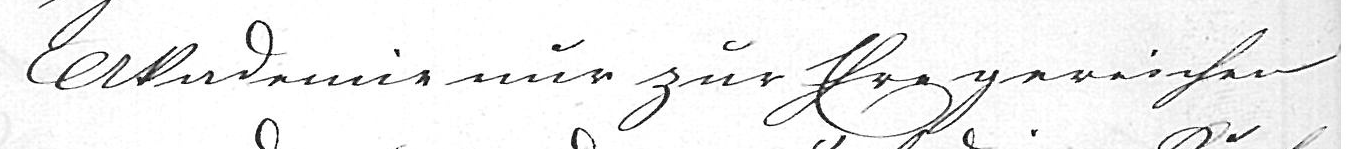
Akademie nur zur Ehre gereichen
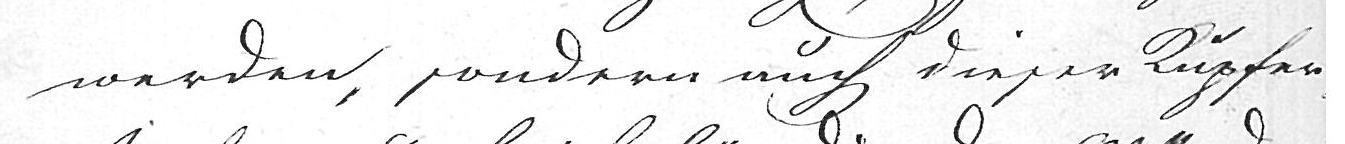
werden, sondern auch dieser Kupfer-
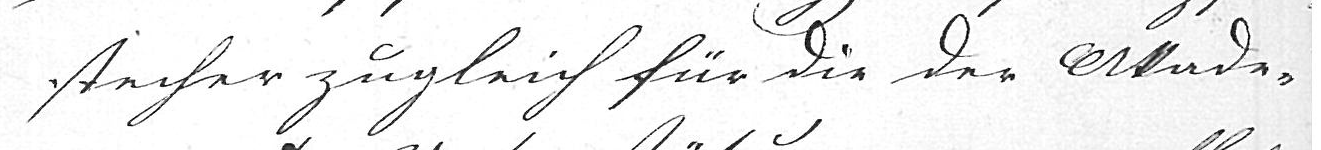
stecher zugleich für die der Akade-
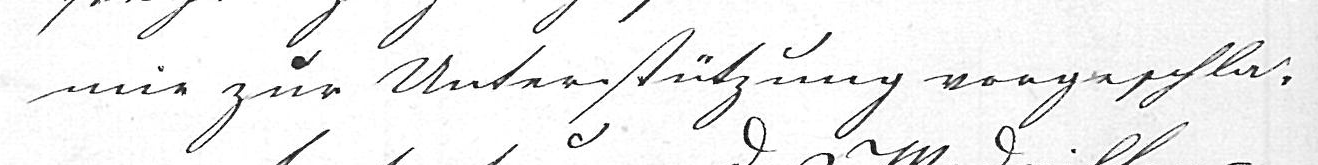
nie zur Unterstützung vorgeschla-
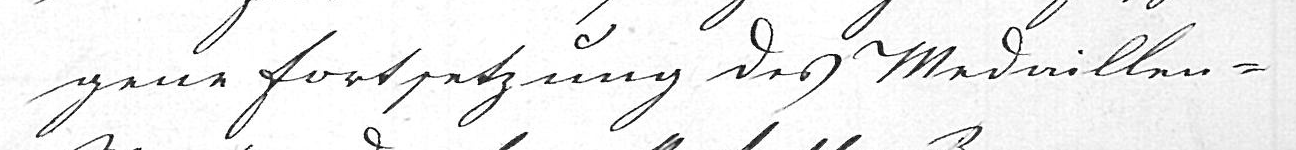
gene Fortsetzung des Medaillen-
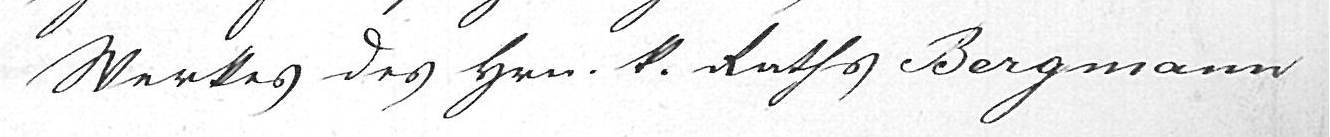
Werkes des Hrn. k. Raths Bergmann
